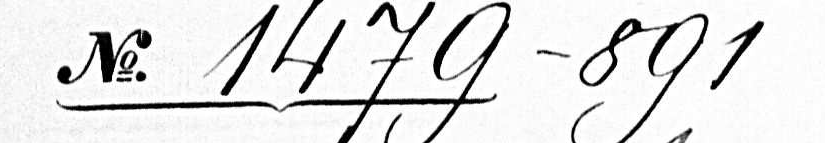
No 1479– 1891
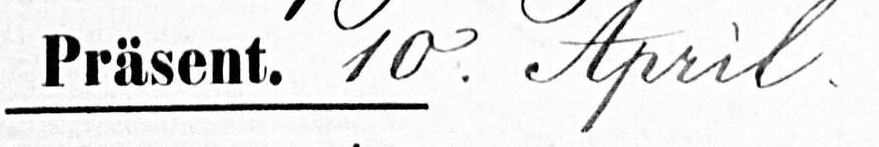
Präsent. – 10. April
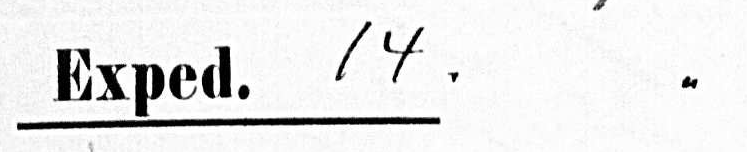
Exped. – 14. „
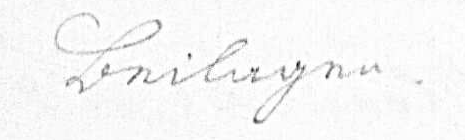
Beilagen
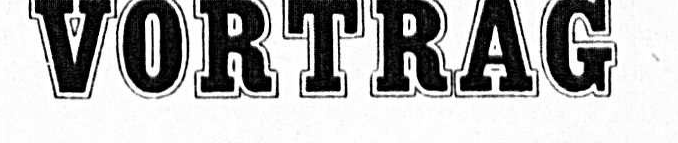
VORTRAG
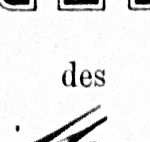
des
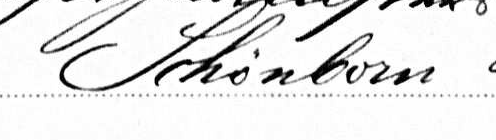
Schönborn
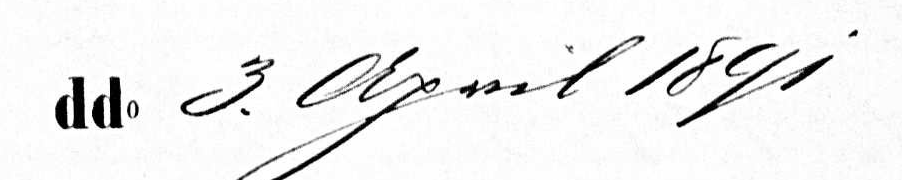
Ddo 3. April 1891
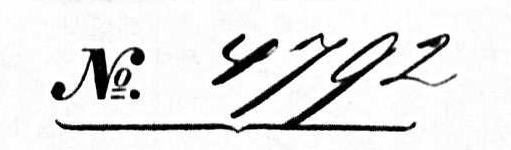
No. 4792
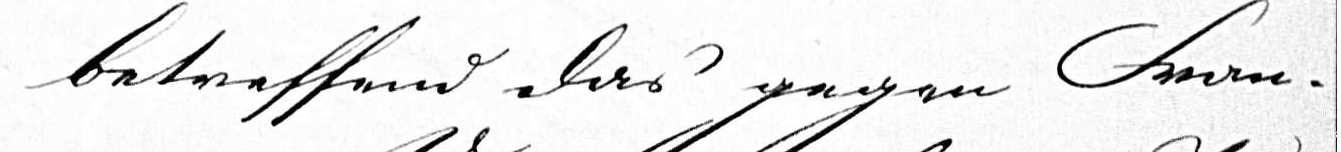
Betreffend das gegen Fran¬
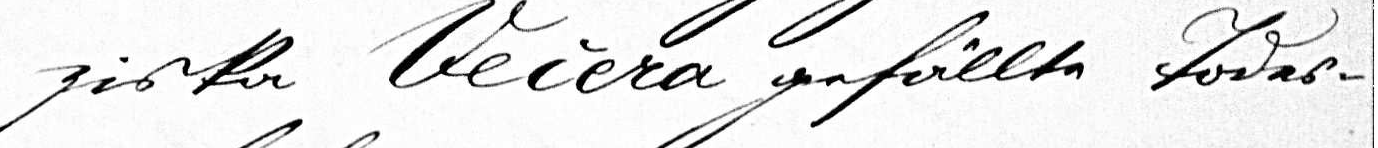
ziska Večera gefällte Todes¬
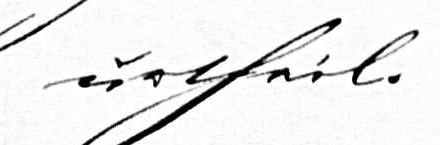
urtheil.
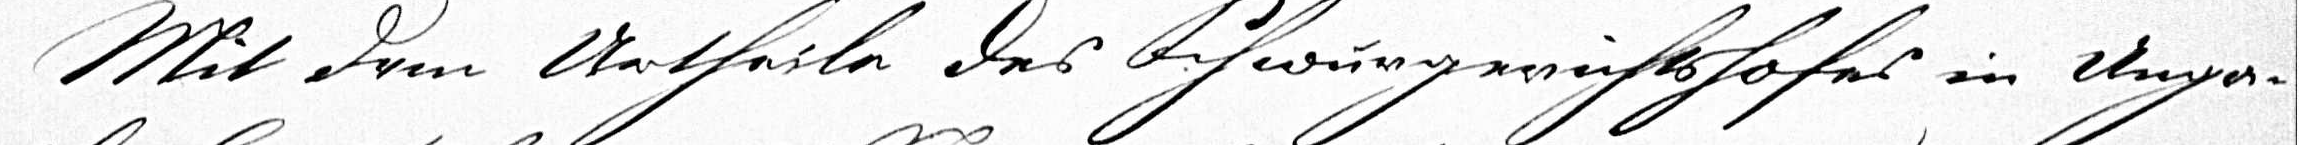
Mit dem Urtheile des Schwurgerichtshofes in Unga¬
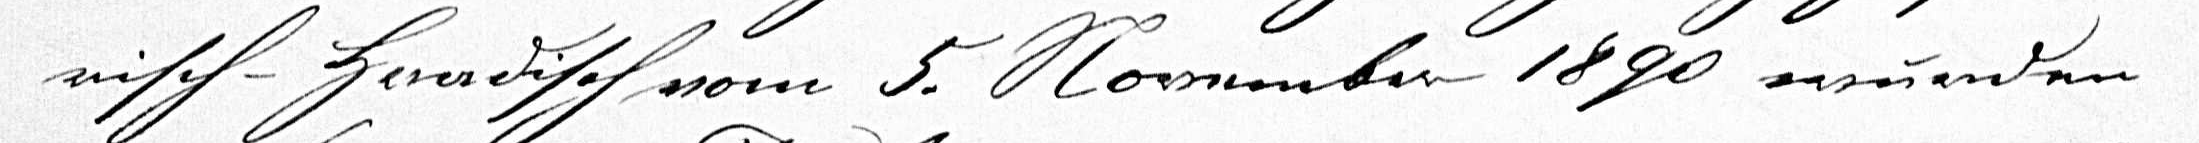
risch-Hradisch vom 5. November 1890 wurden
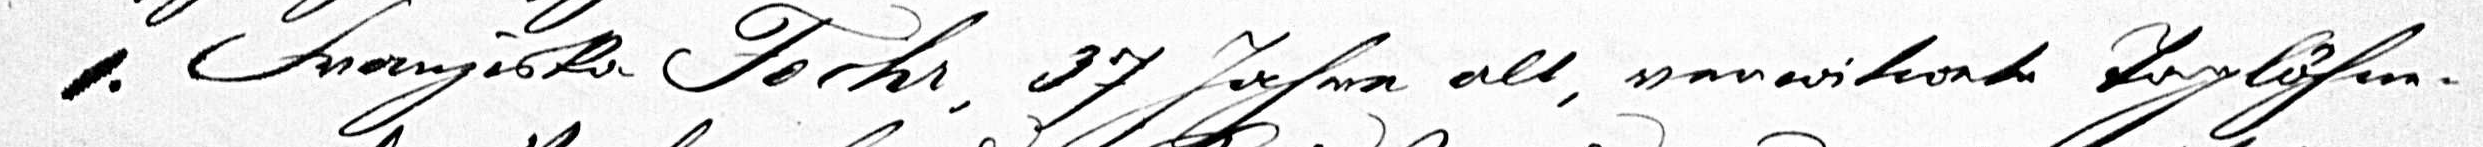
1. Franziska Foehr, 37 Jahre alt, verwitwete Taglöhne¬
